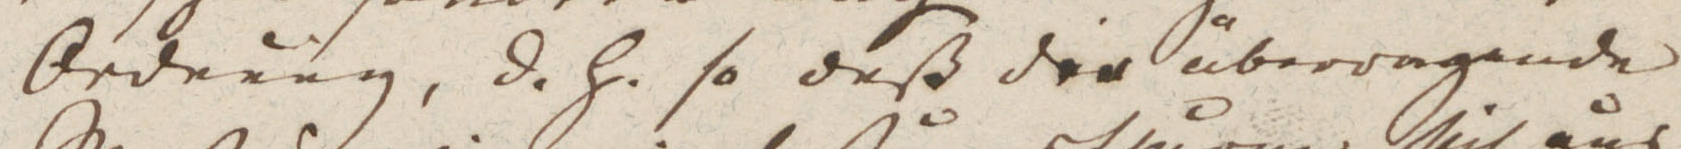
Ordnung, d. h. so dass derie überragende
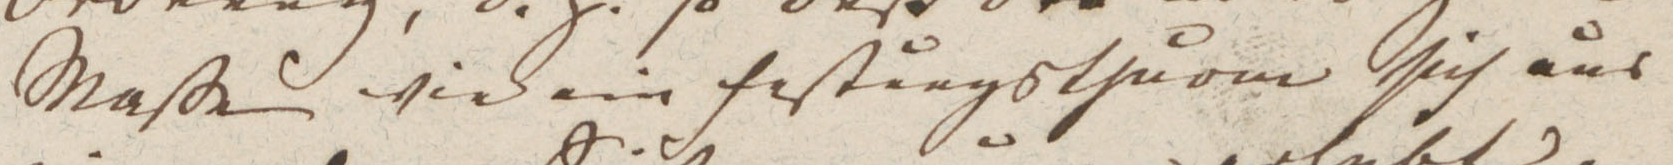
Masse wie ein Festungsthurm sich aus
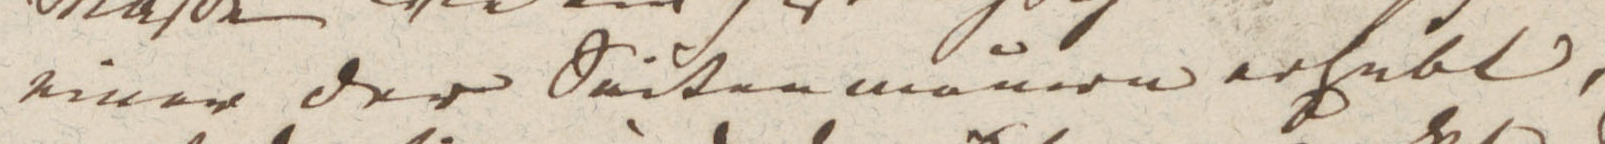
einer der Seitenmauern erhebt,
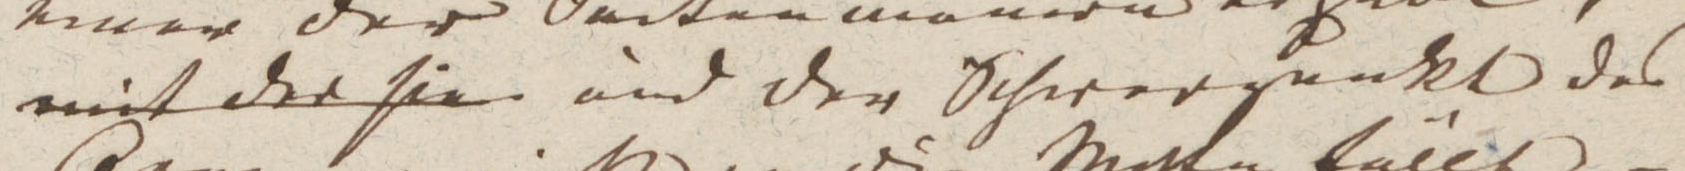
mit der sie und der Schwerpunkt des
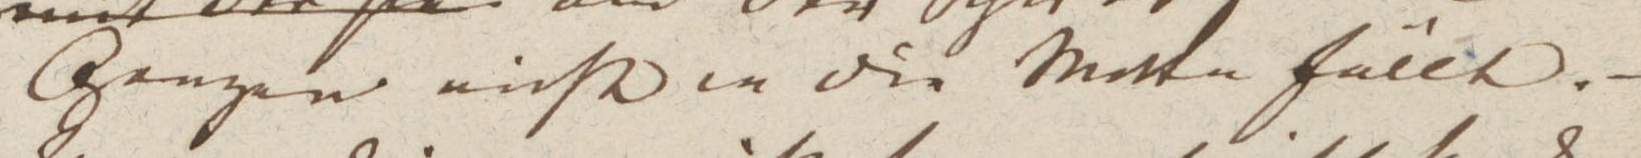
Ganzen nicht in die Mitte fällt. –
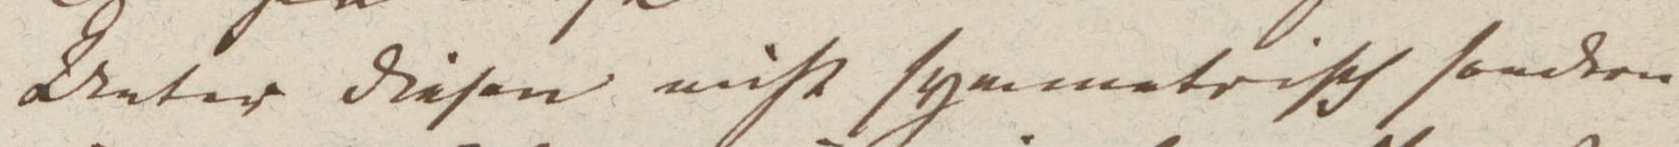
Unter diesen nicht symmetrisch sondern
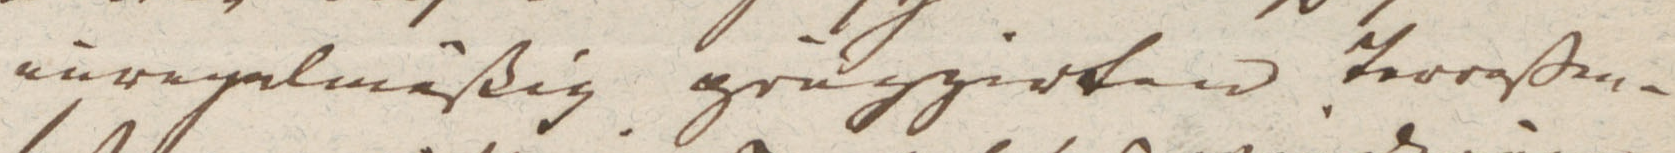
unregelmässig gruppirten Terrassen-
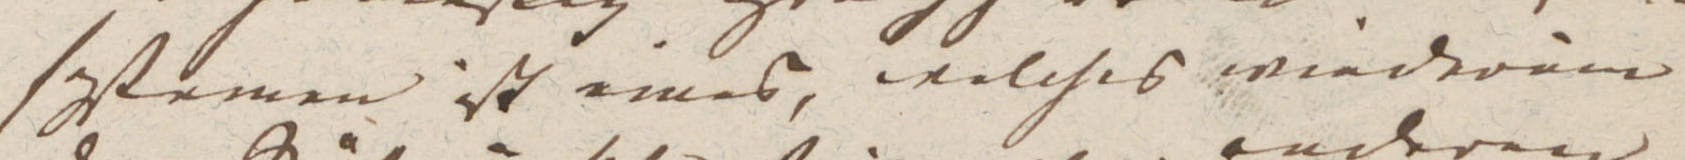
systemen ist eines, welches wiederum
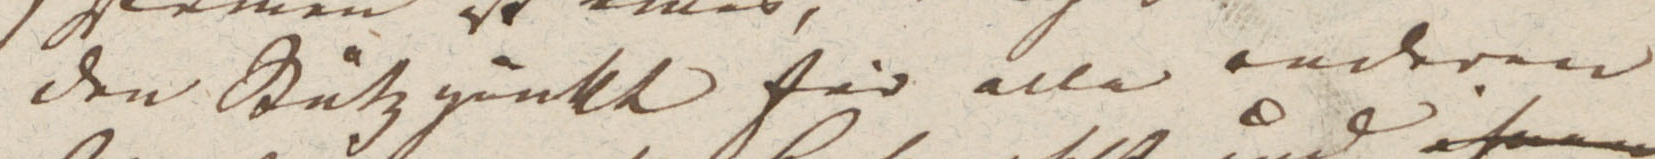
den Stützpunkt für alle anderen
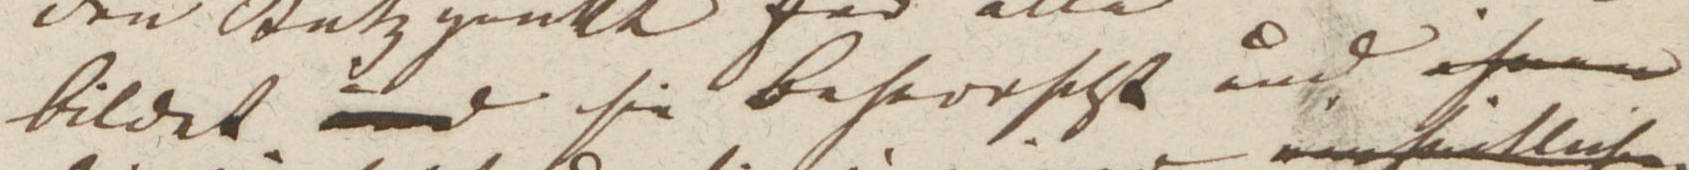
bildet und sie beherrscht und ihnen
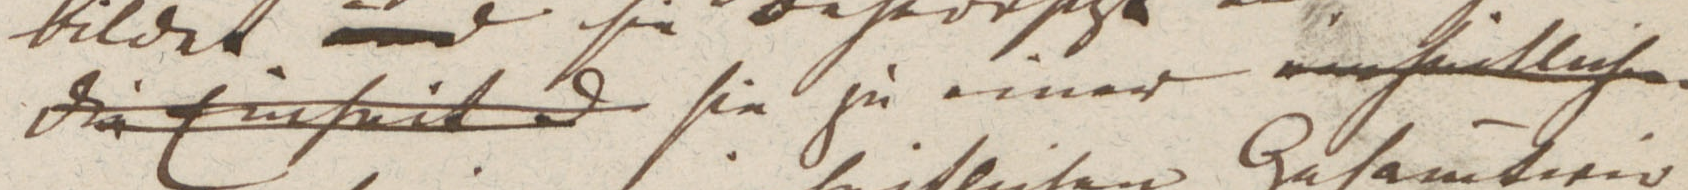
die Einheit d sie zu einer einheitlichen
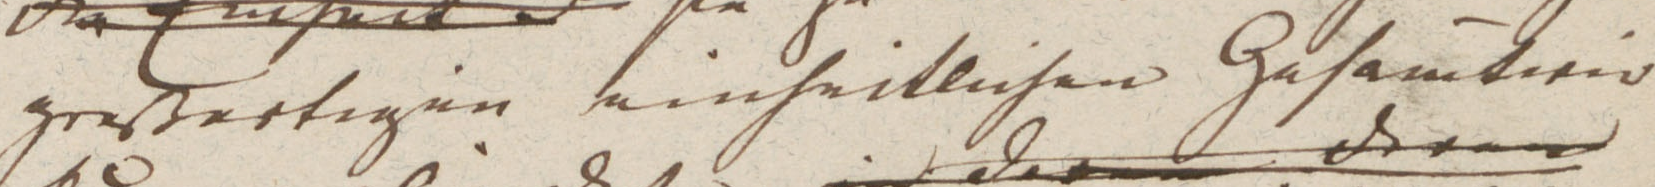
grossartigen einheitlichen Gesammtwir
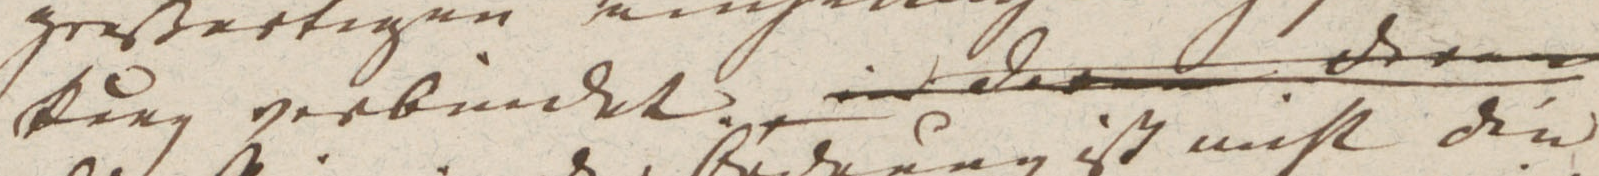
kung verbindet,. in deren deren
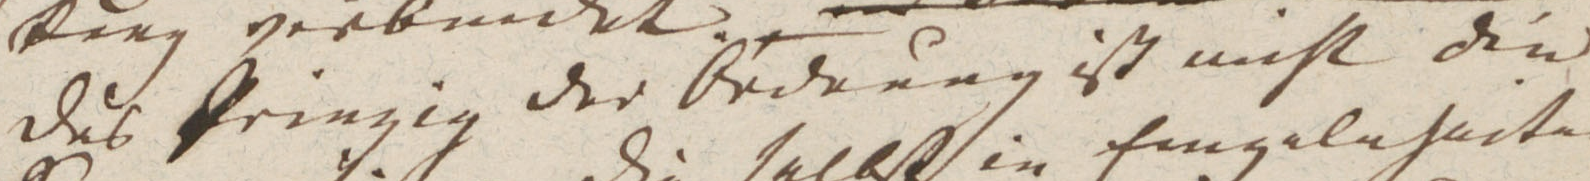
Das Prinzip der Ordnung ist nicht die
